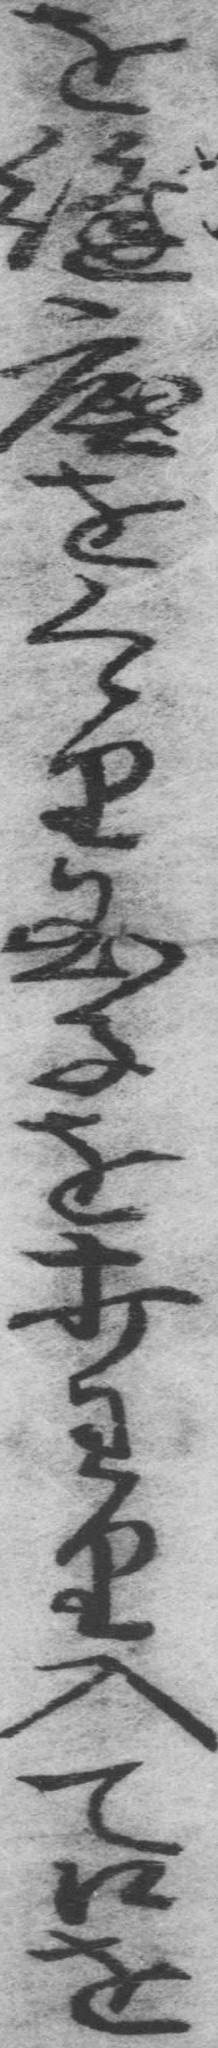を縫底をくゝり玉子を打わり入て口を
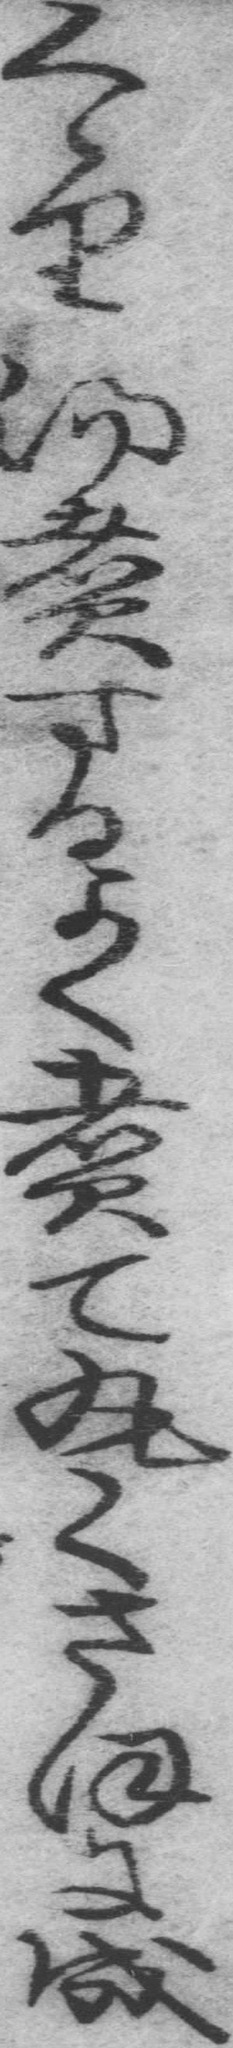くゝり湯煮するよく煮て丸くさほに成
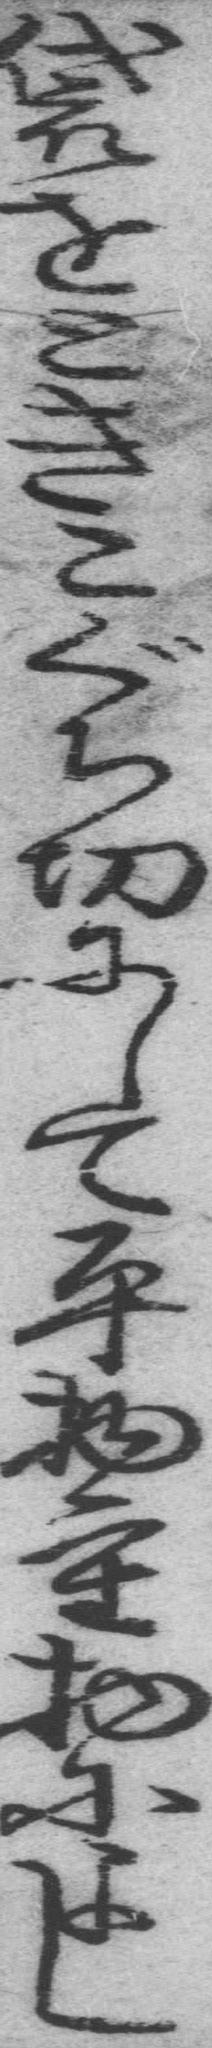袋をときこぐち切にして平物重物によし
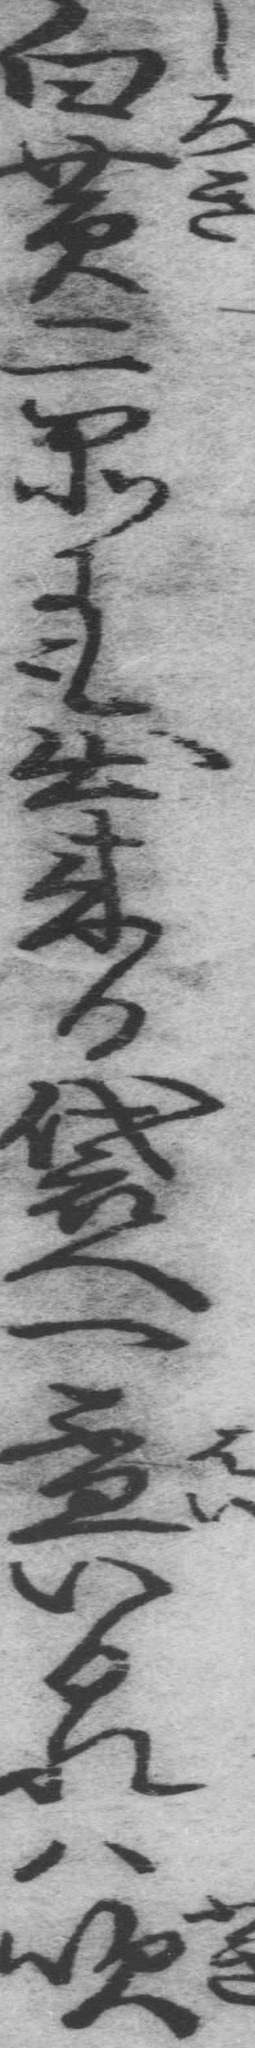白黄二品にも出来る袋へ一盃いるれは吹

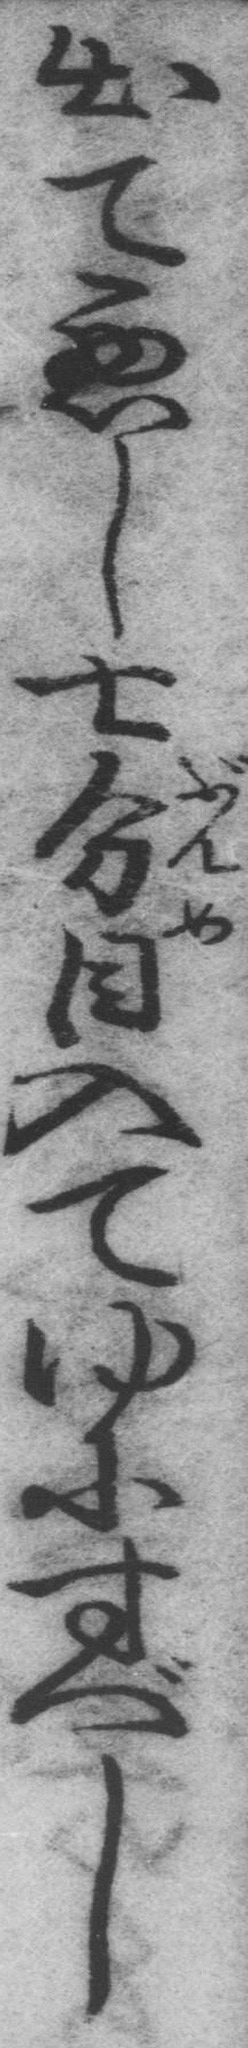出て悪し七分目入てゆにすべし
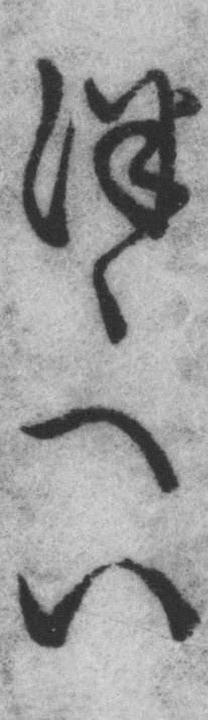づゝへい
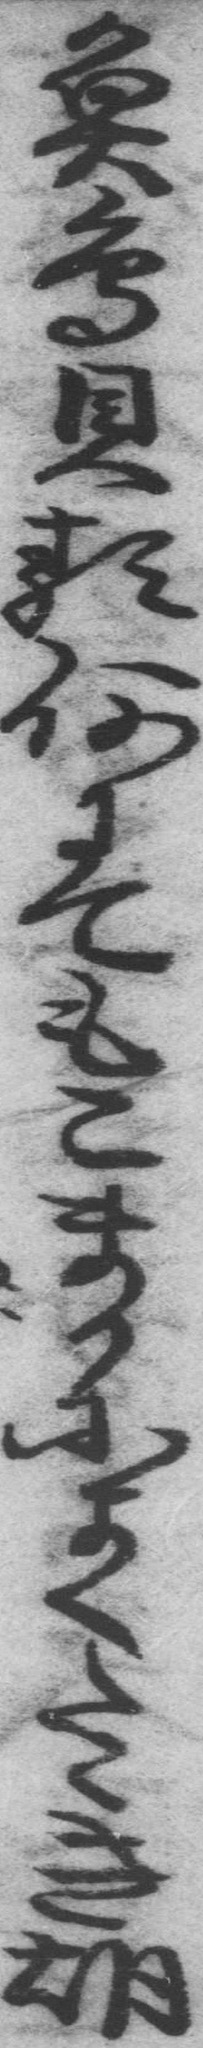魚鳥貝類何にてもこまかによくたゝき後胡
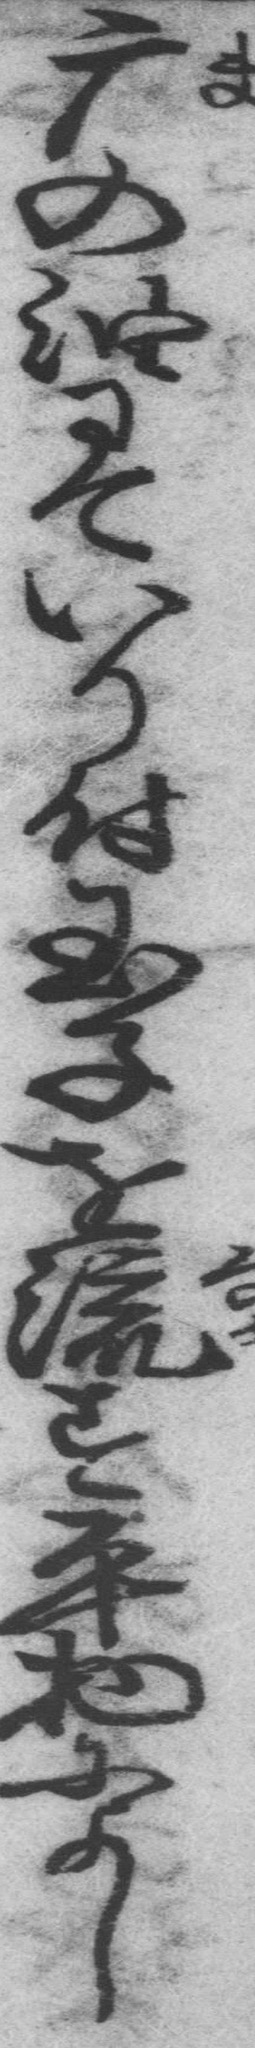麻の油にていり付卵を流す平物によし
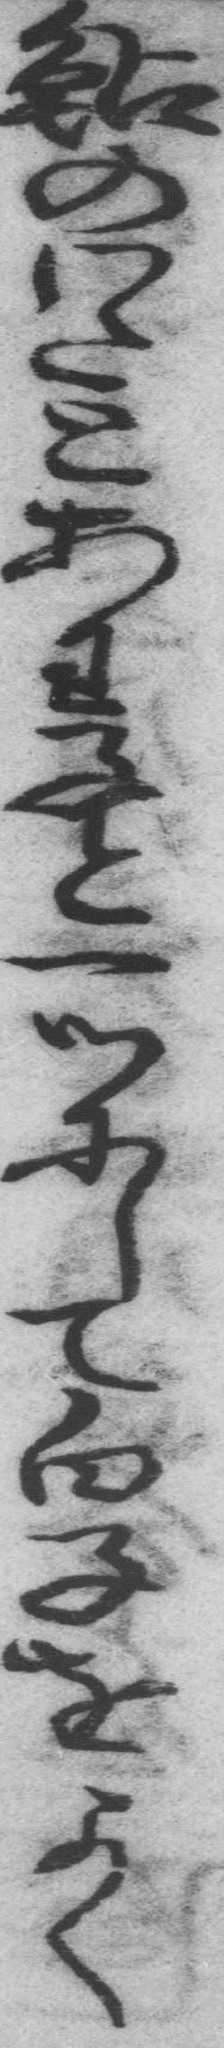鮎のわたとあわ子と一ツにして白子をよく
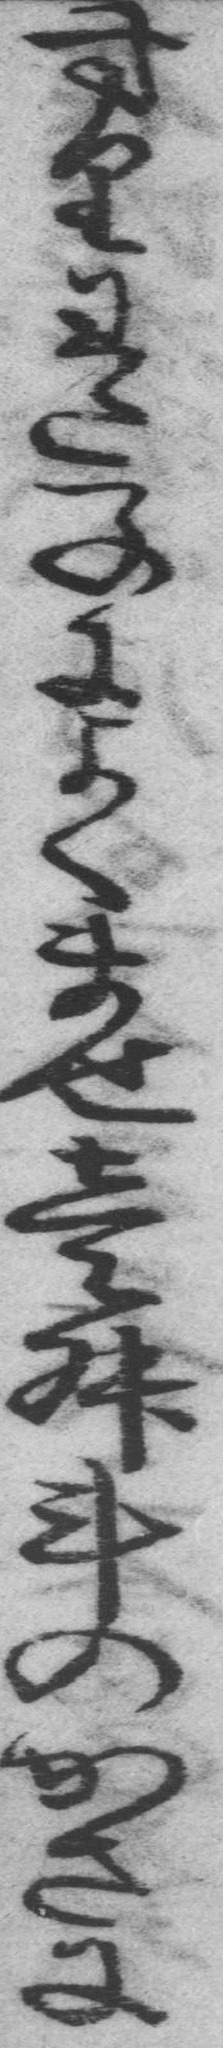すりわた子によくませ壱升斗のかさに
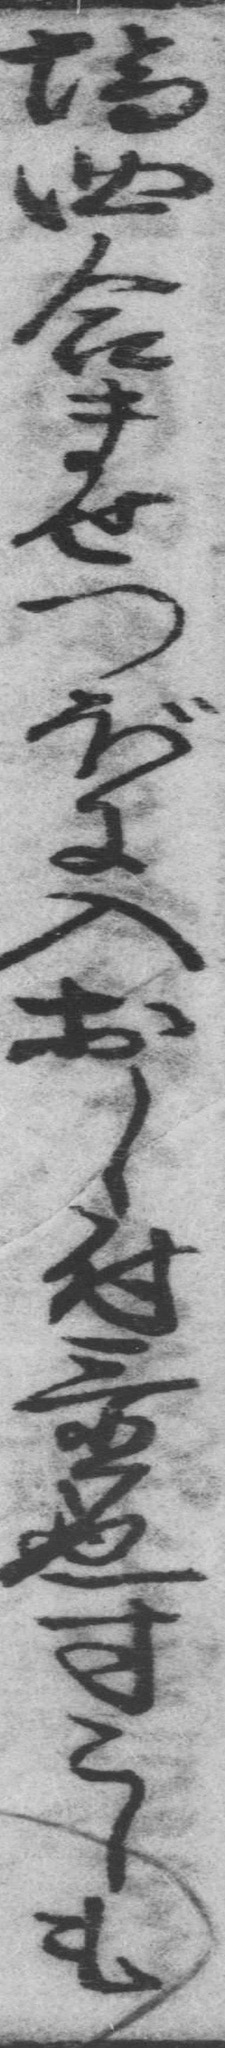塩四合ませつぼに入おし付置也すこしも
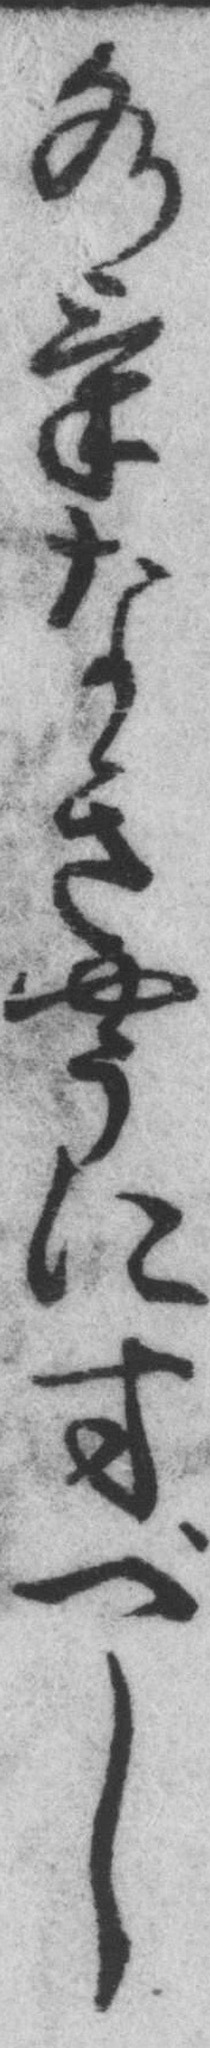水気なきやうにすべし
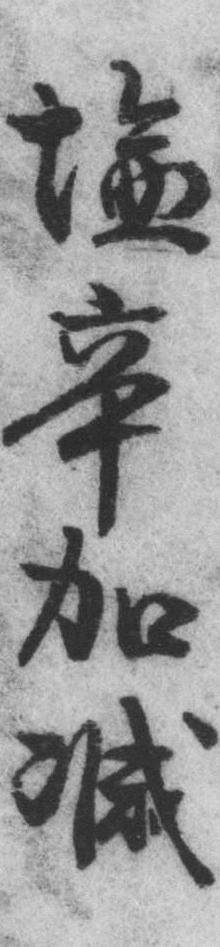塩辛加減
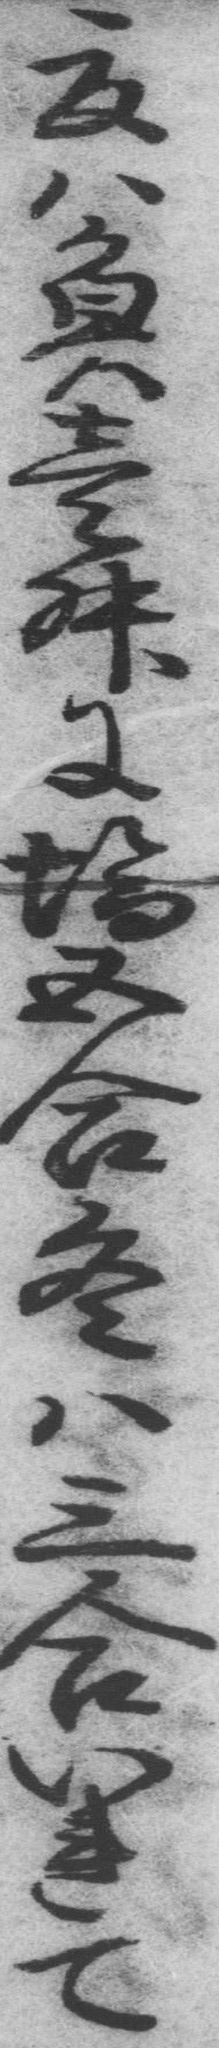夏は魚は壱升に塩五合冬は三合いれて
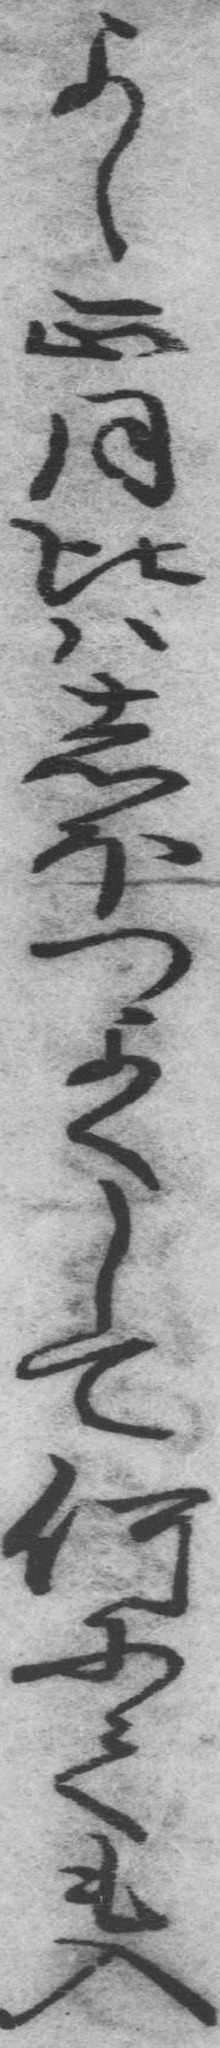よし正月比はしほつよくして何にても入
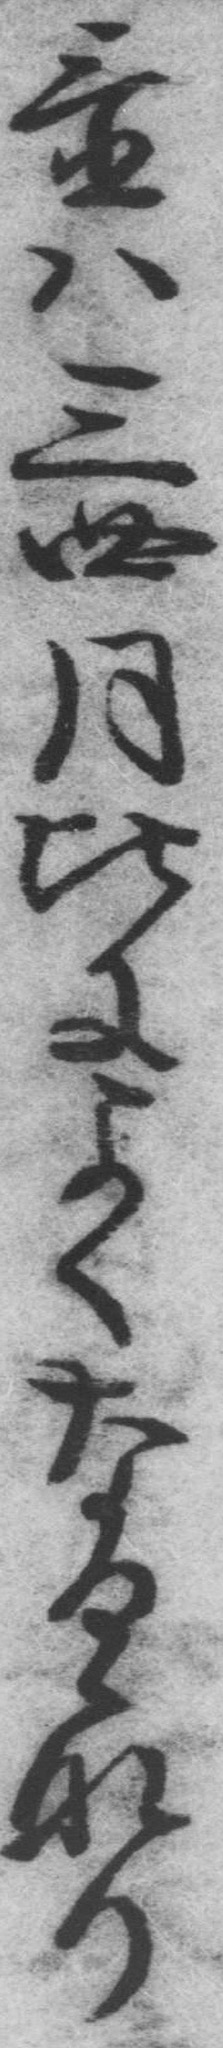置は三四月比によくなるゝなり
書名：料理山海郷
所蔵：大阪府立大学学術情報センター 国文学研究資料館
